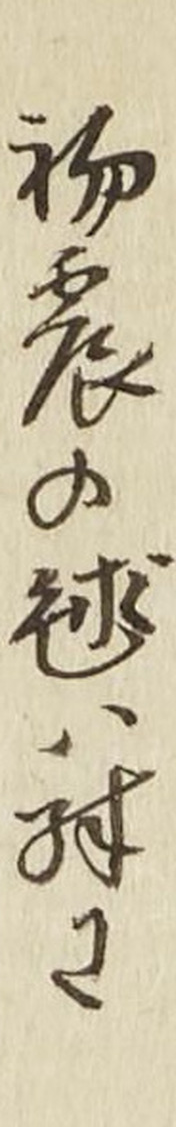初震の毬は殊に
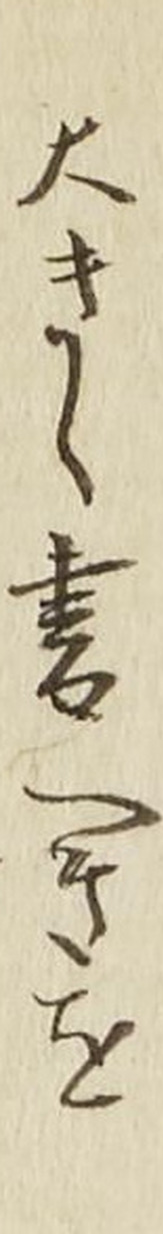大きく書へきを
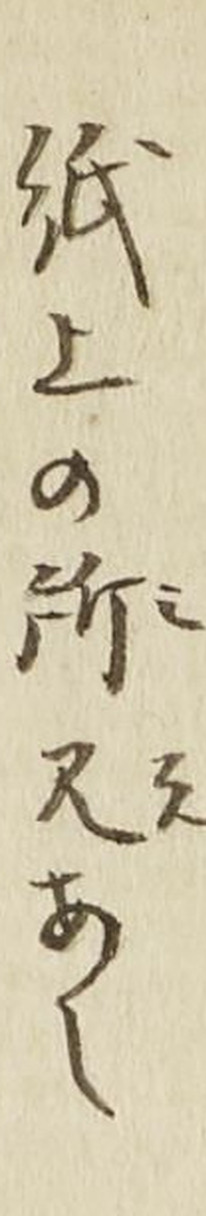紙上の所見あし
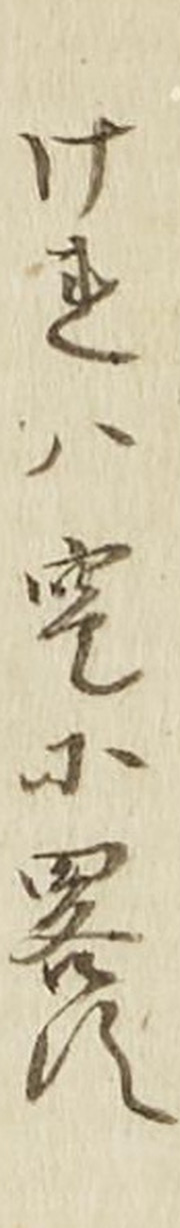けれは爰に略す

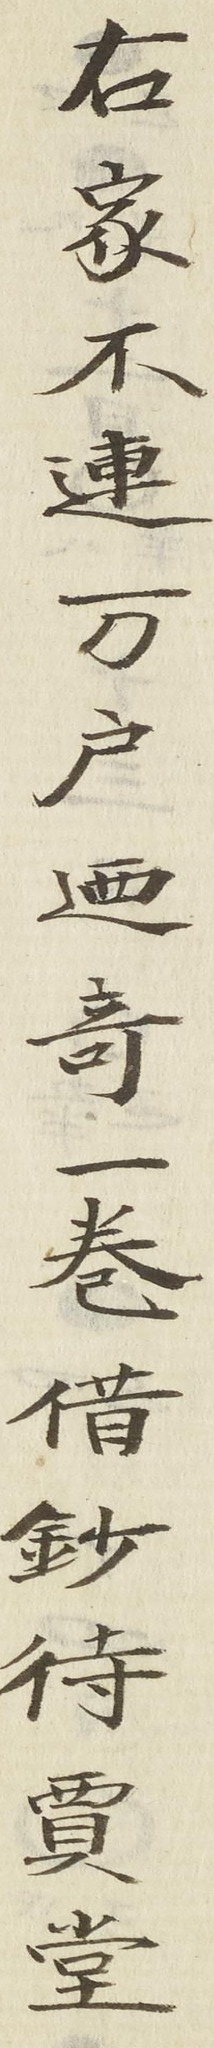右家不連万戸迺奇一巻借鈔待賈堂
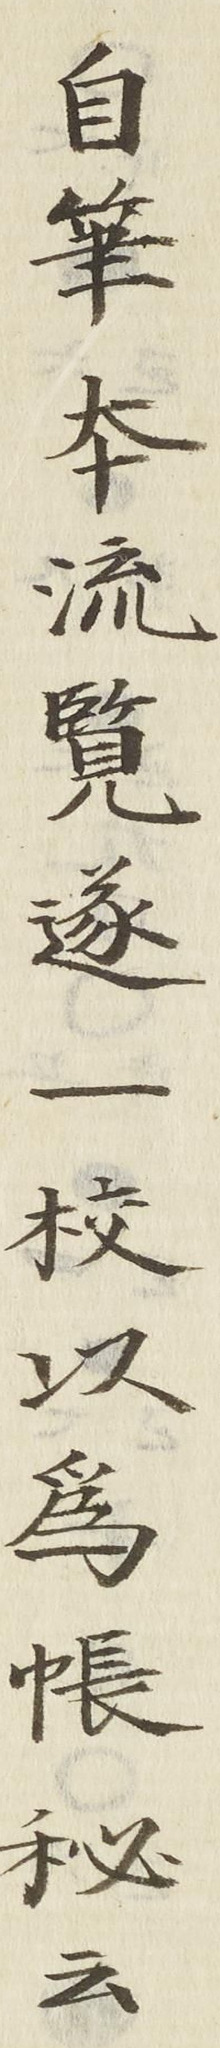自筆本流覧逐一校以為帳秘云
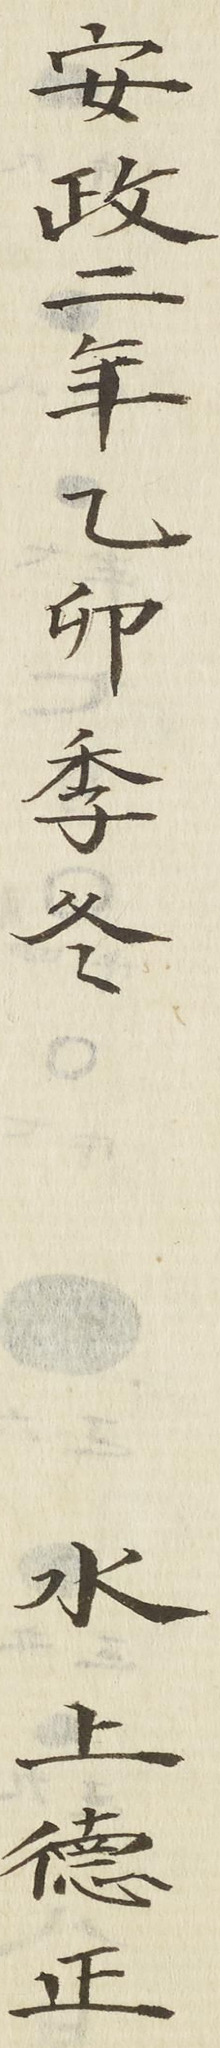安政二年乙卯季冬水上徳正
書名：やぶれ窓の記　全
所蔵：東京大学地震研究所図書室 Earthquake Research Institute Library, The University of Tokyo, JAPAN
